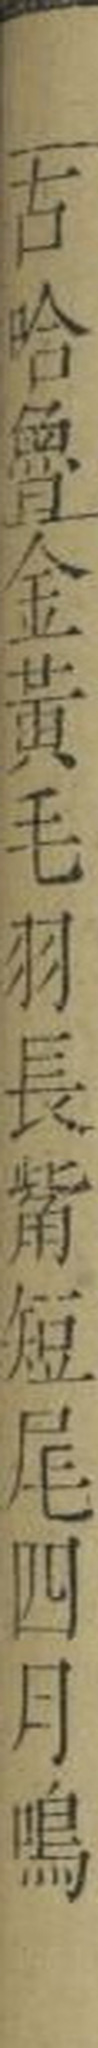[古哈魯]金黄毛羽長觜短尾四月鳴
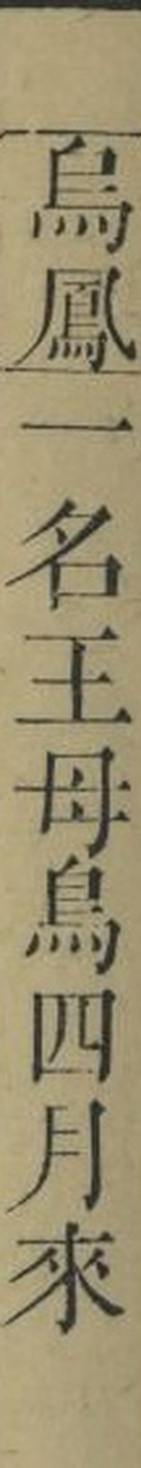[烏鳳]一名王母鳥四月来
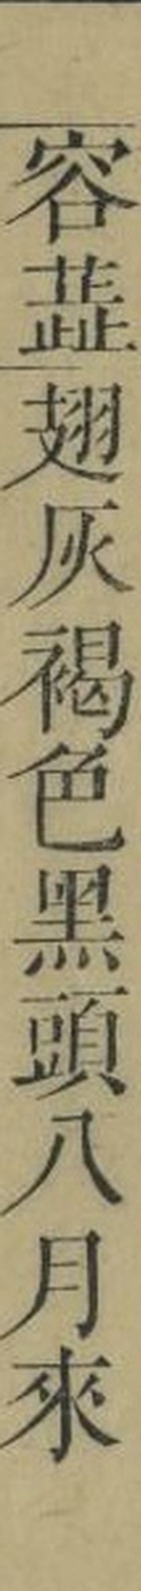[容蕋]翅灰褐色黒頭八月来
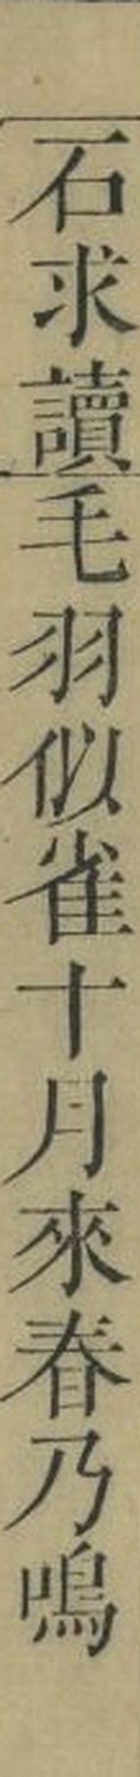[石求読]毛羽似雀十月来春乃鳴
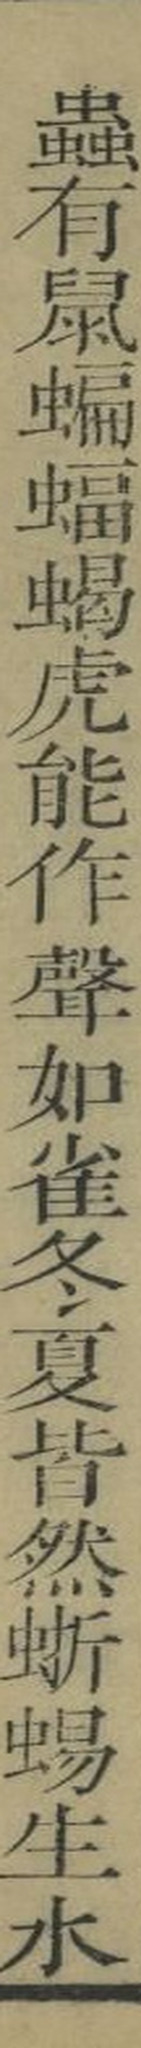虫有鼠蝙蝠蝎虎能作声如雀冬夏皆然蜥蜴生水
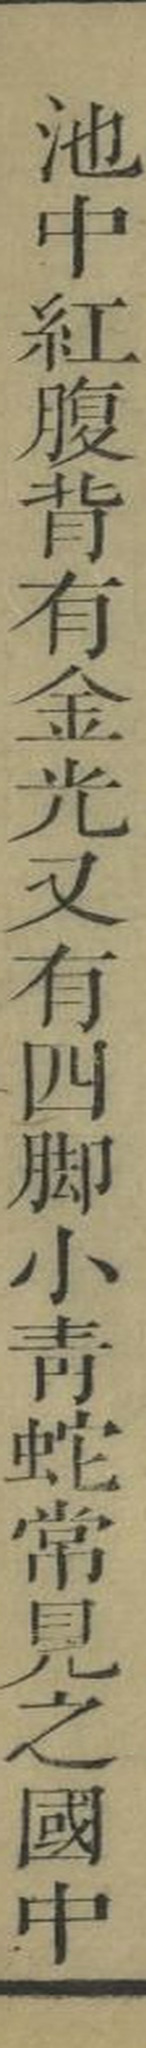池中紅腹背有金光又有四脚小青蛇常見之国中

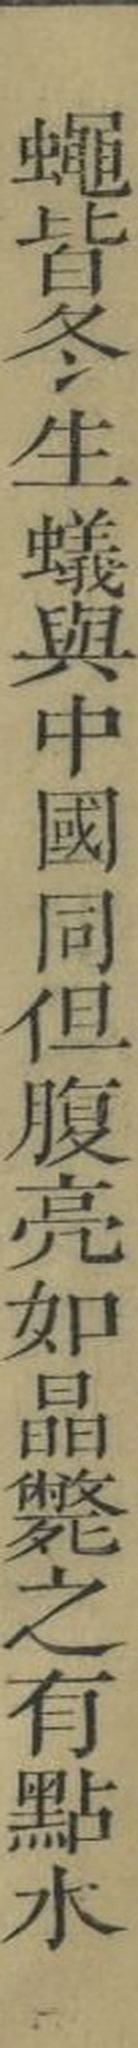蠅皆冬生蟻与中国同但腹亮如晶斃之有点水
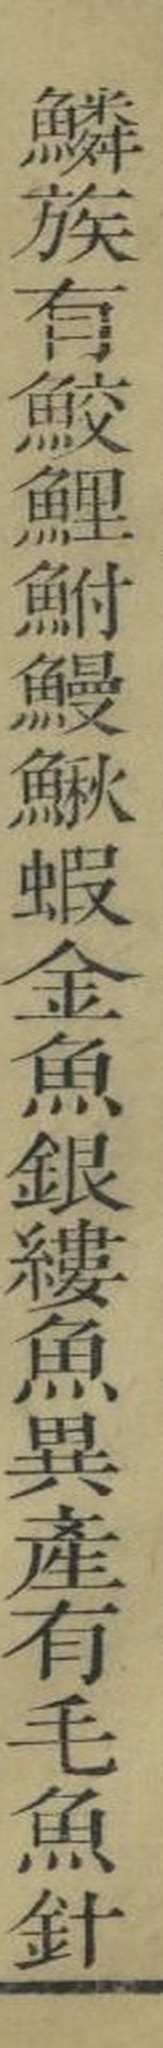鱗族有鮫鯉鮒鰻鰍蝦金魚銀縷魚異産有毛魚針
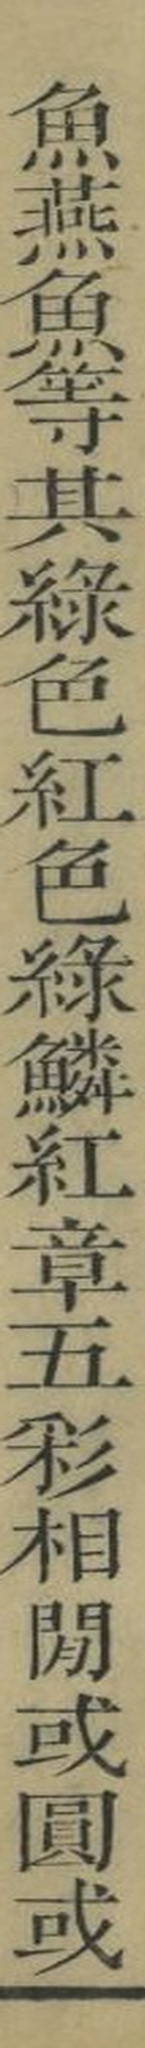魚燕魚等其緑色紅色緑鱗紅章五彩相間或円或
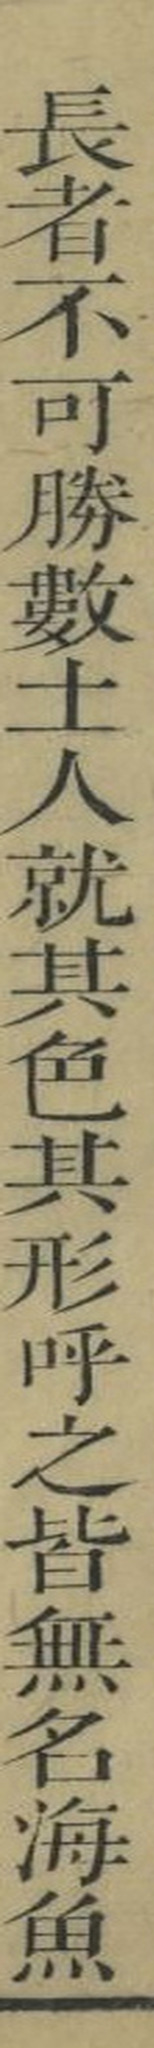長者不可勝数土人就其色其形呼之皆無名海魚
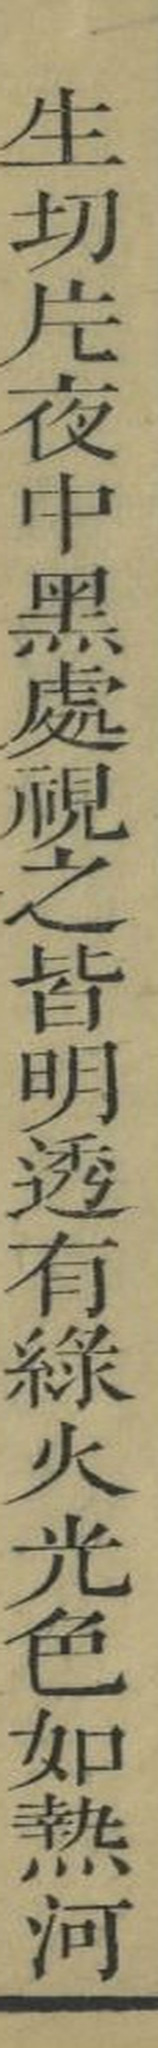生切片夜中黒処視之皆明透有緑火光色如熱河
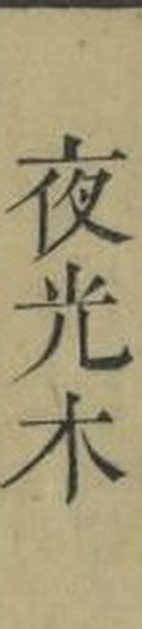夜光木
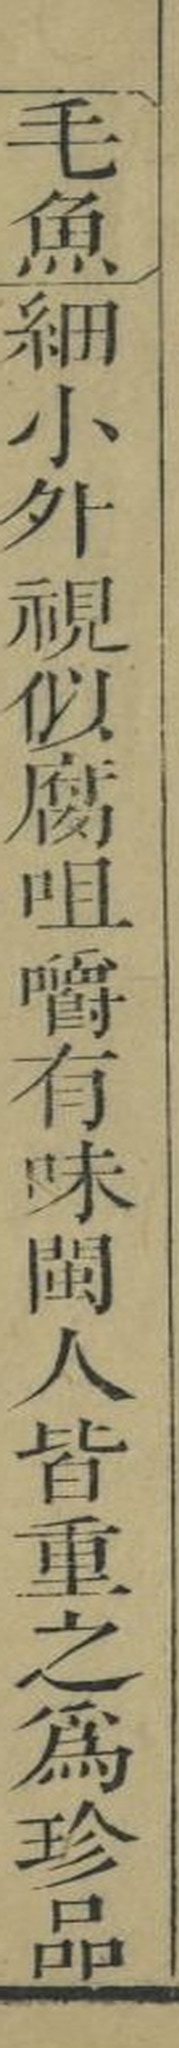[毛魚]細小外視似腐咀嚼有味閩人皆重之為珍品
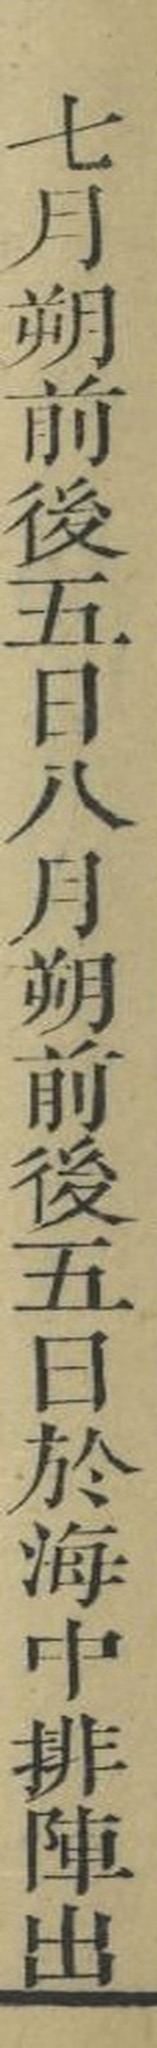七月朔前後五日八月朔前後五日於海中排陣出
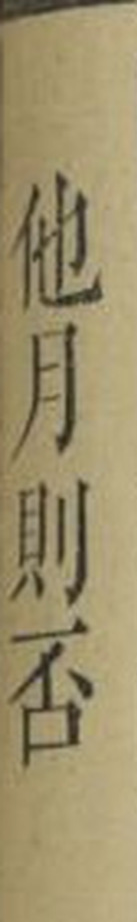他月則否
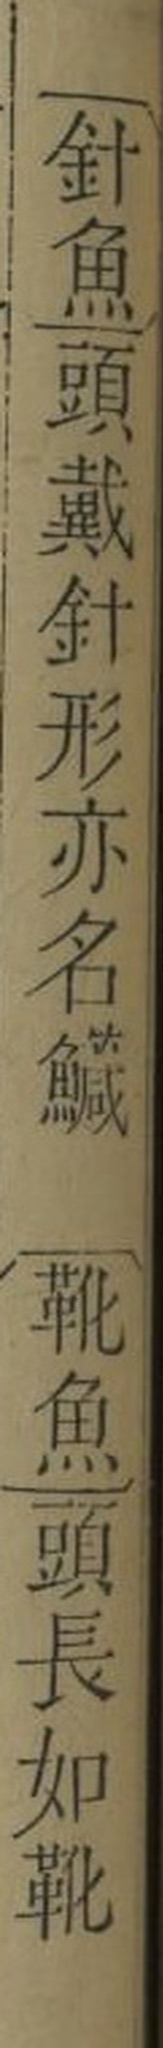[針魚]頭戴針形亦名鱵[靴魚]頭長如靴
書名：中山伝信録 巻六
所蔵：University of the Ryukyus Library
